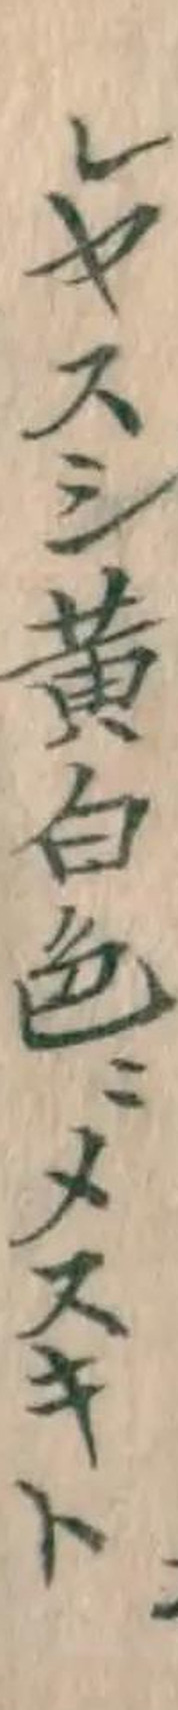レヤスシ黄白色ニシテスキト
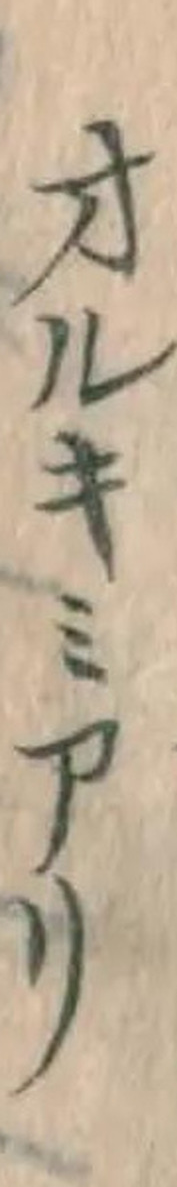オルキミアリ

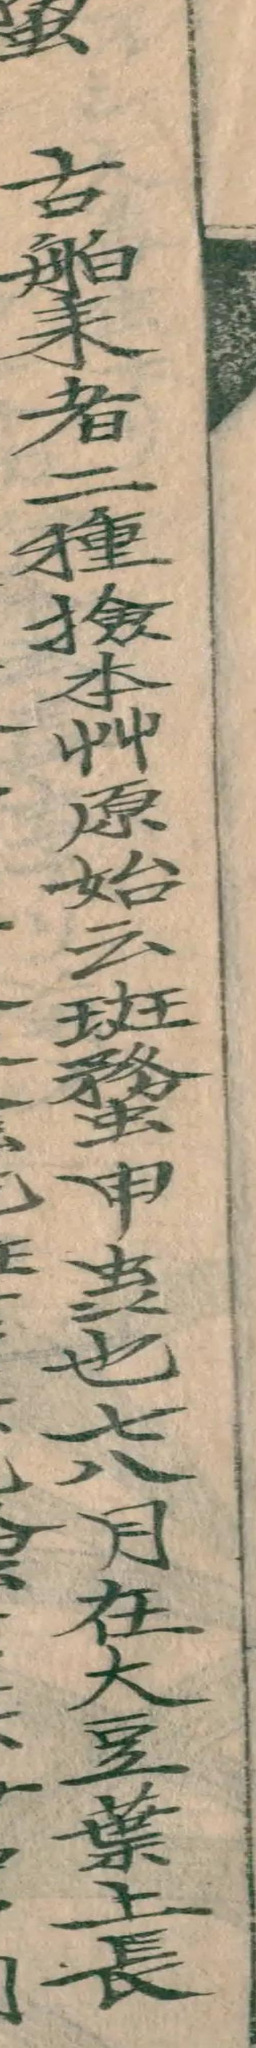斑𧎻＃古舶来者二種検本草原始云斑𧎻甲蟲也七八月在大豆葉上長
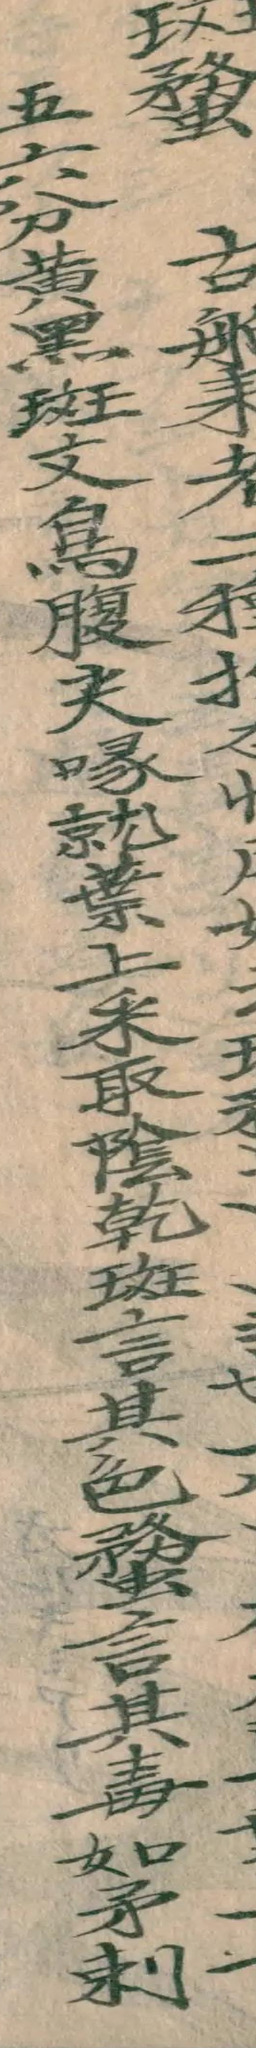五六分黄黒斑文鳥腹尖喙就葉上釆取陰乾斑言其色𧎻言其毒如矛刺
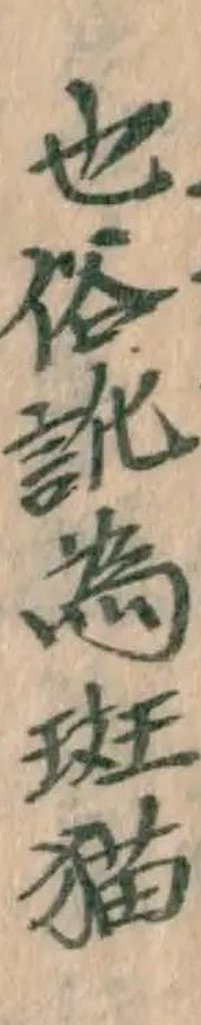也俗訛為斑猫
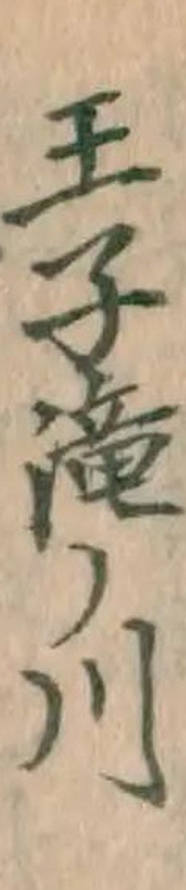王子滝ノ川
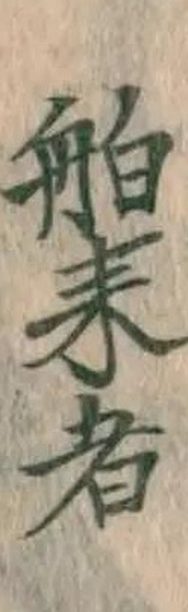舶来者
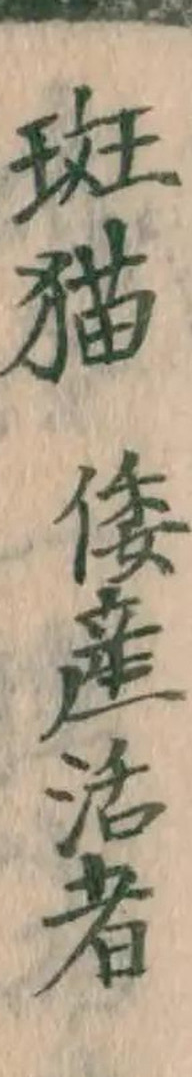斑猫倭産活者
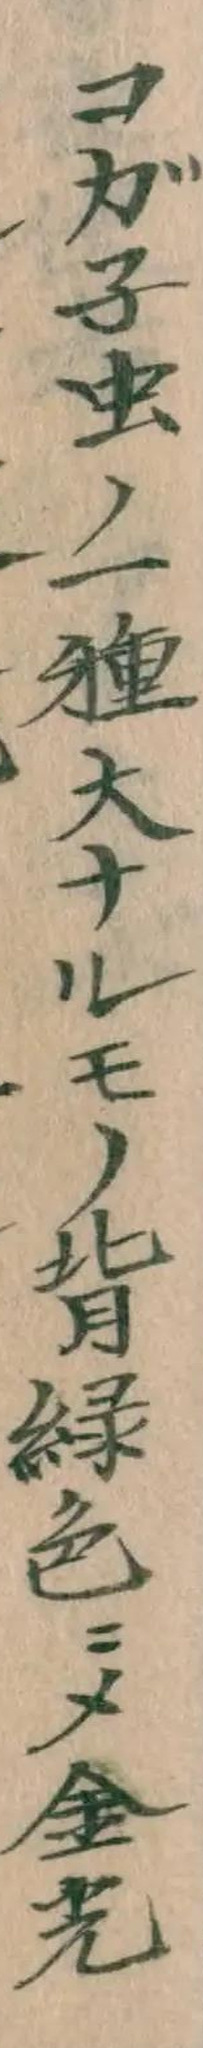コガネ虫ノ一種大ナルモノ背緑色ニシテ金光
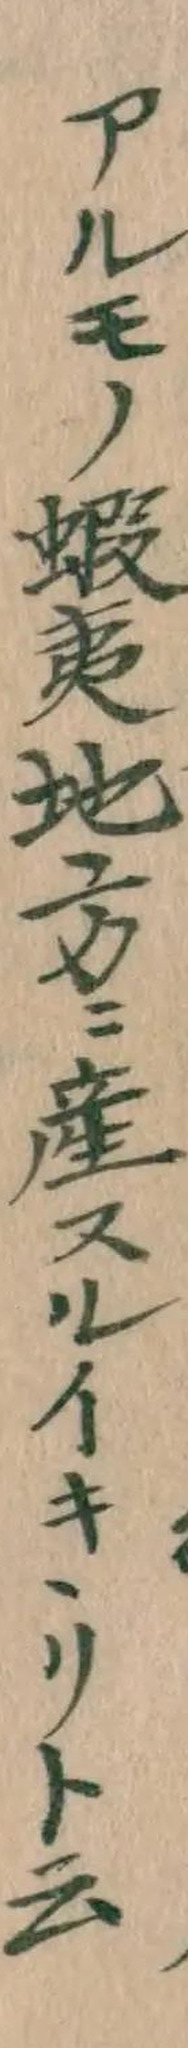アルモノ蝦夷地方ニ産スルイキヽリト云
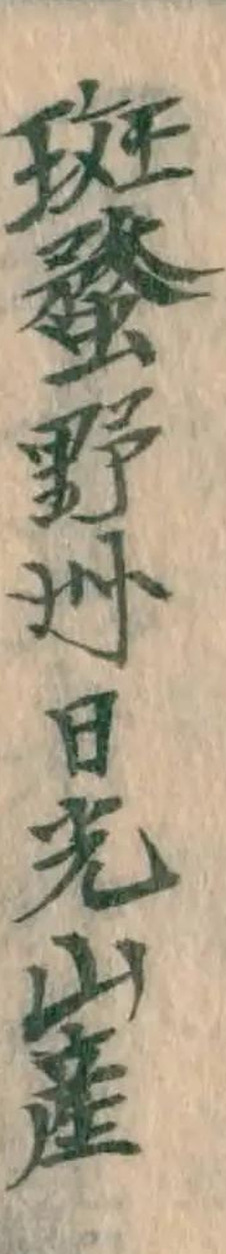斑蝥野州日光山産
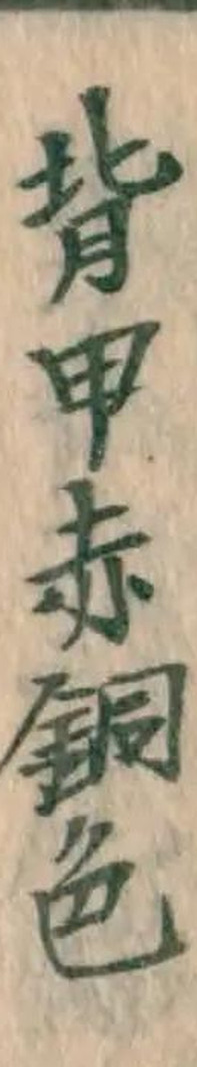背甲赤銅色

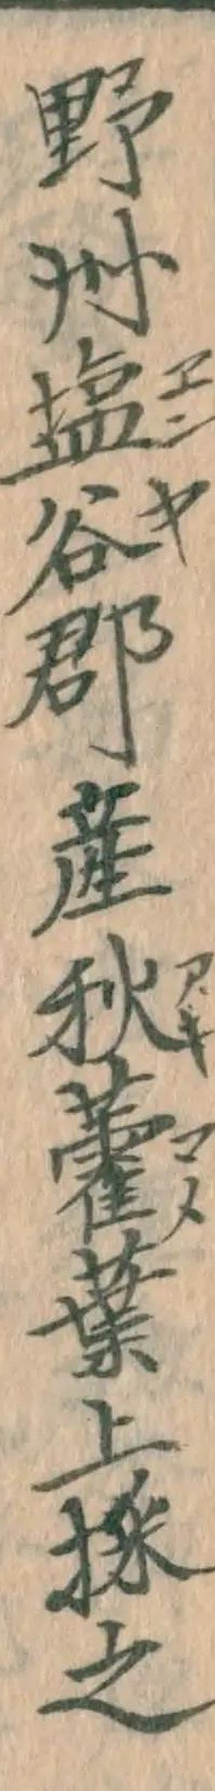野州塩谷郡産秋藿葉上採之
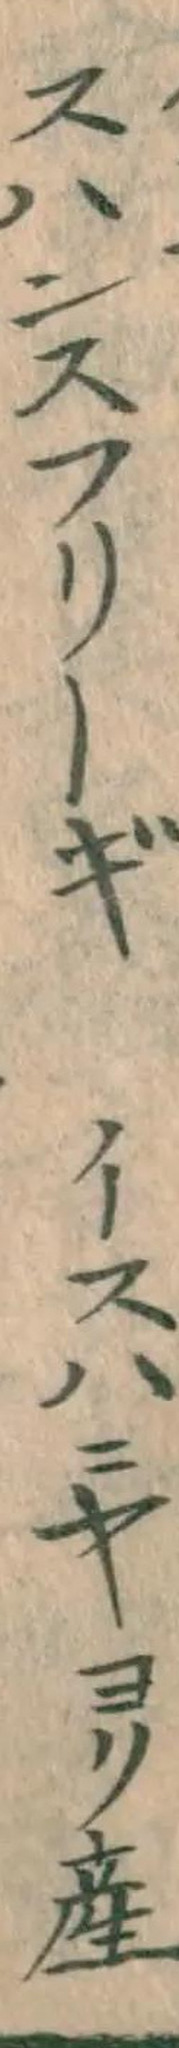スハンスフリーギイスハニヤヨリ産
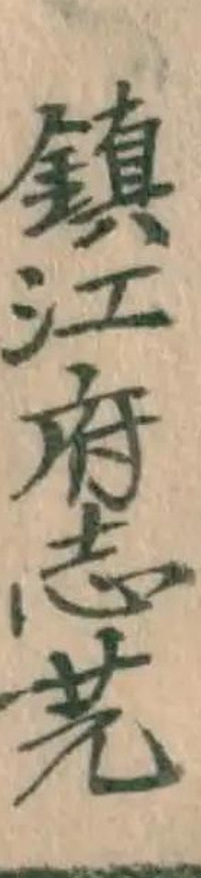鎮江府志芫
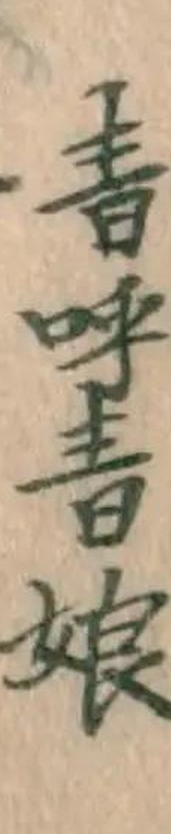青呼青娘
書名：千蟲譜 3巻. [3]
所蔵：国立国会図書館 National Diet Library, JAPAN
